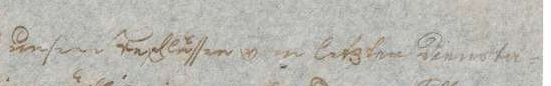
unsern Beschlüssen vom letzten Diensta-
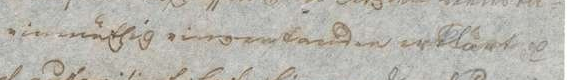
ge einmüthig einverstanden erklärt &
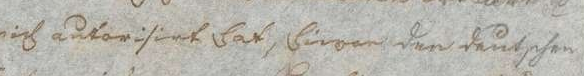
mich autorisirt hat, hievon den deutschen
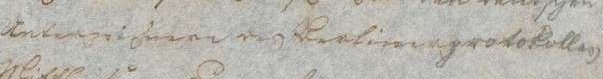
Unterzeichnern des Berlinerprotokolles
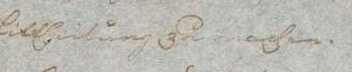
Mittheilung zu machen.
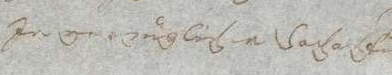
In vorzüglicher Hochachtung
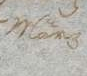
Escher
